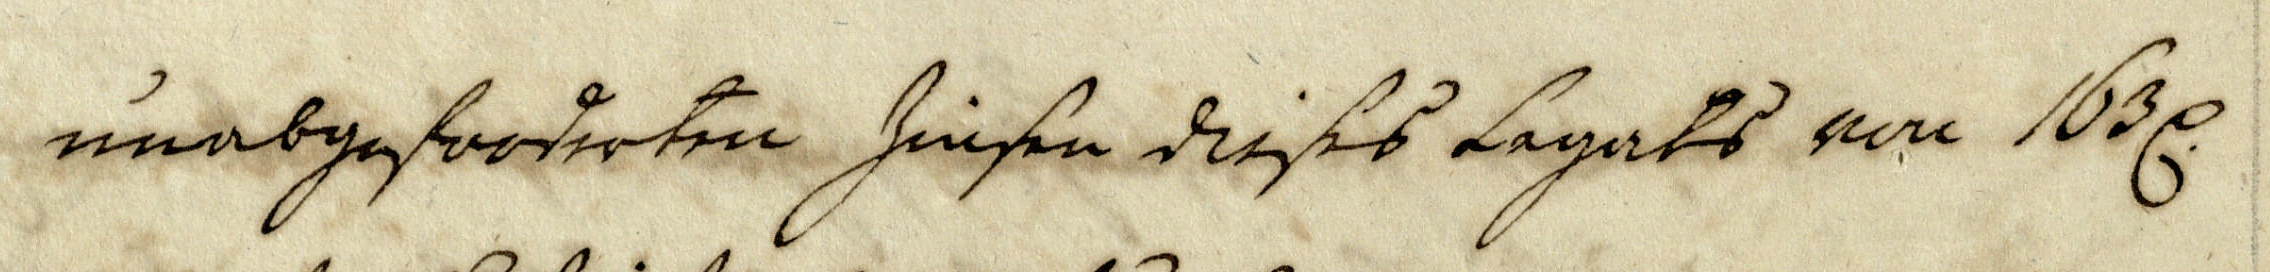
unabgeforderten Zinsen dieses Legats von 163 l.
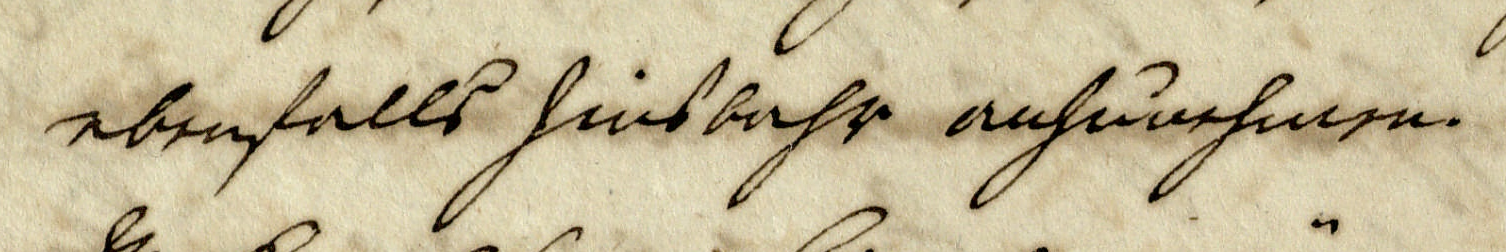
ebenfalls zinsbahr anzunehmen.
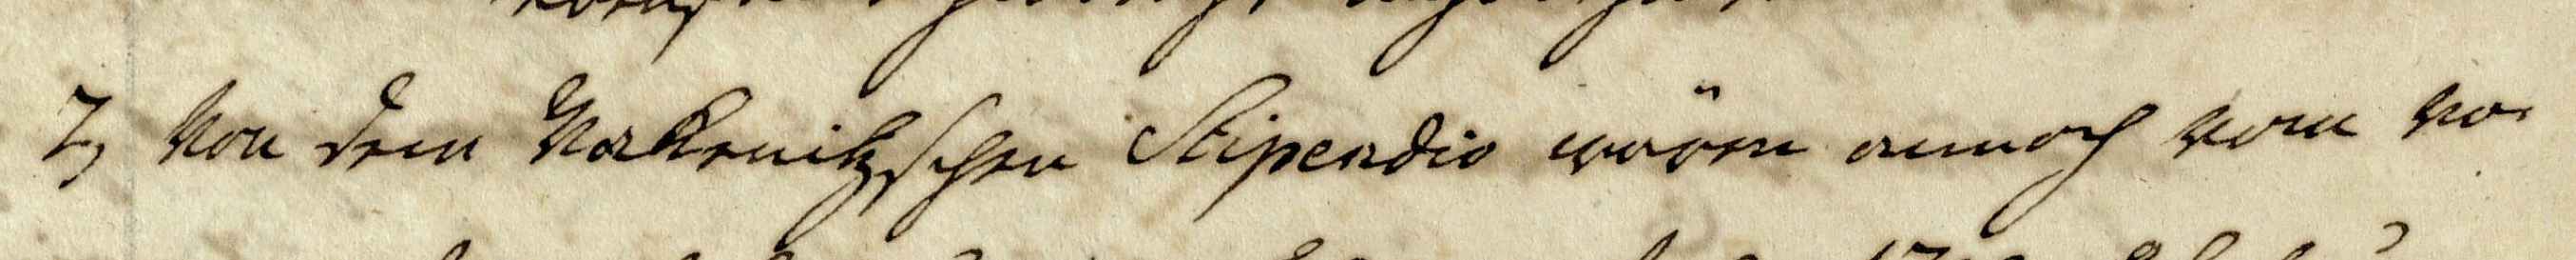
7, von dem Wakenitzschen Stipendio wären annoch vom vo¬
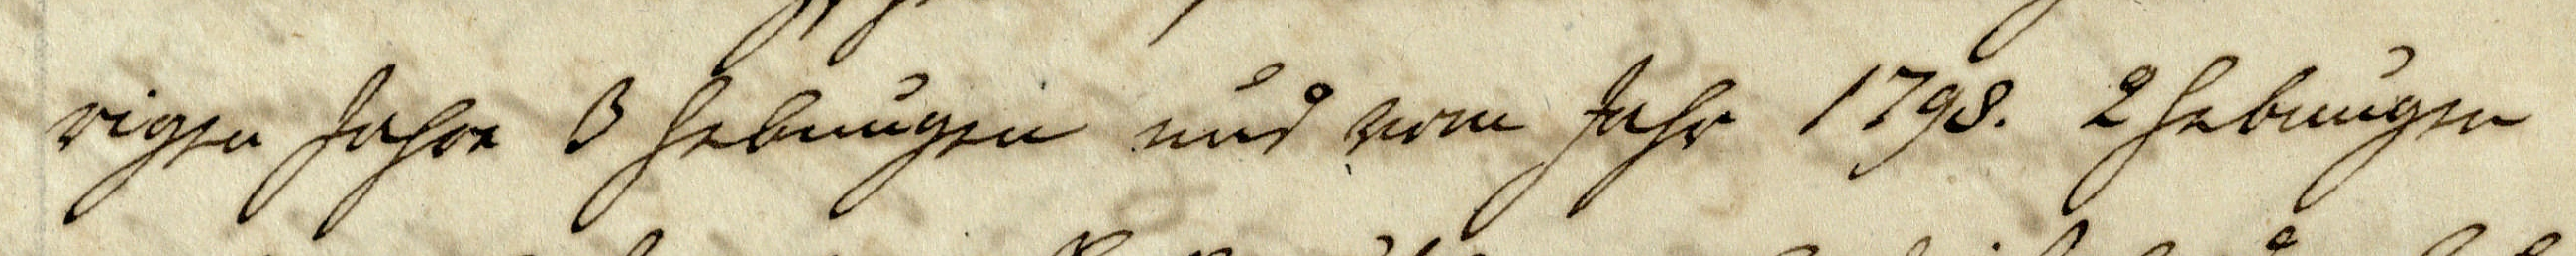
rigen Jahre 3 Hebungen und vom Jahr 1798. 2 Hebungen
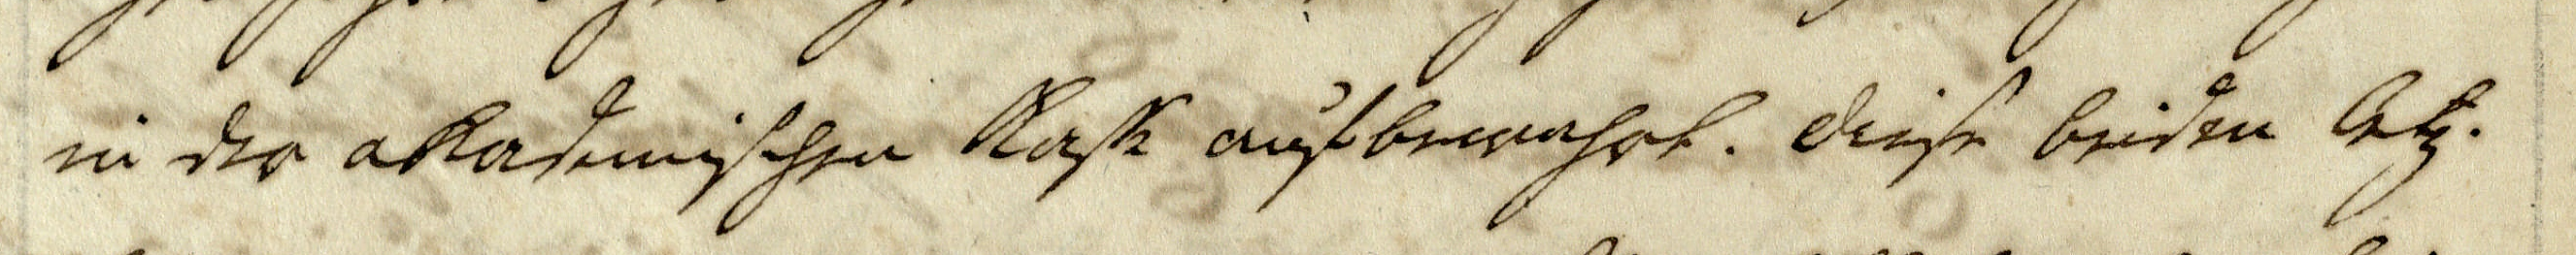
in der akademischen Kasse aufbewahrt. Diese beiden letz¬
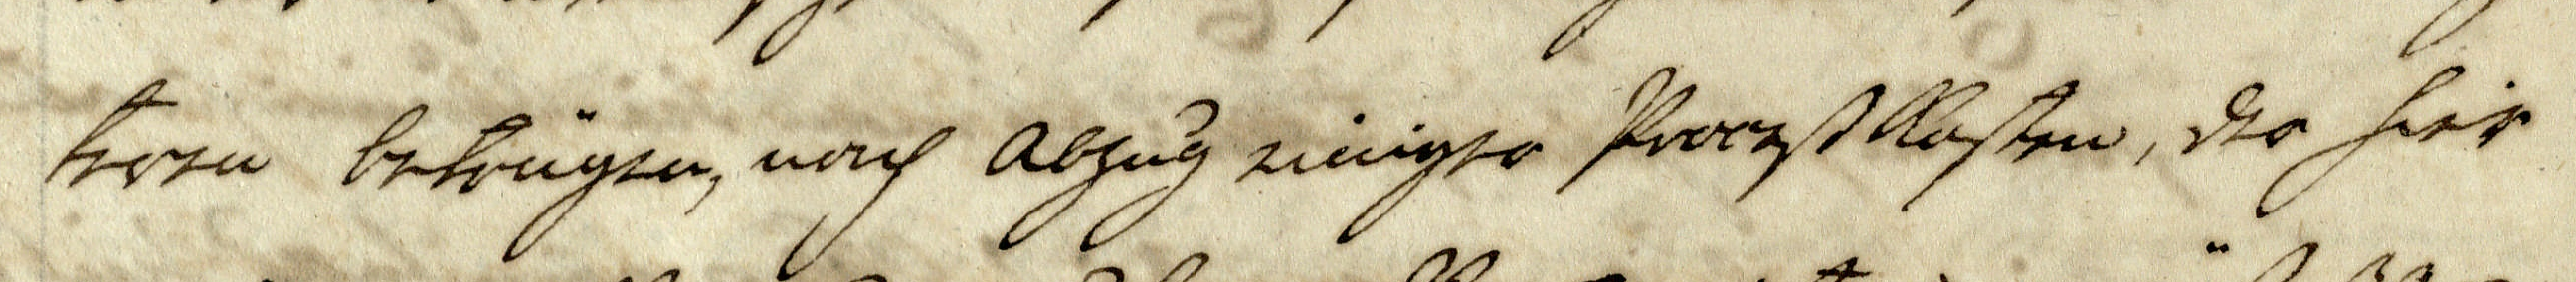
teren betrügen, nach Abzug einiger Proceß Kosten, der hier
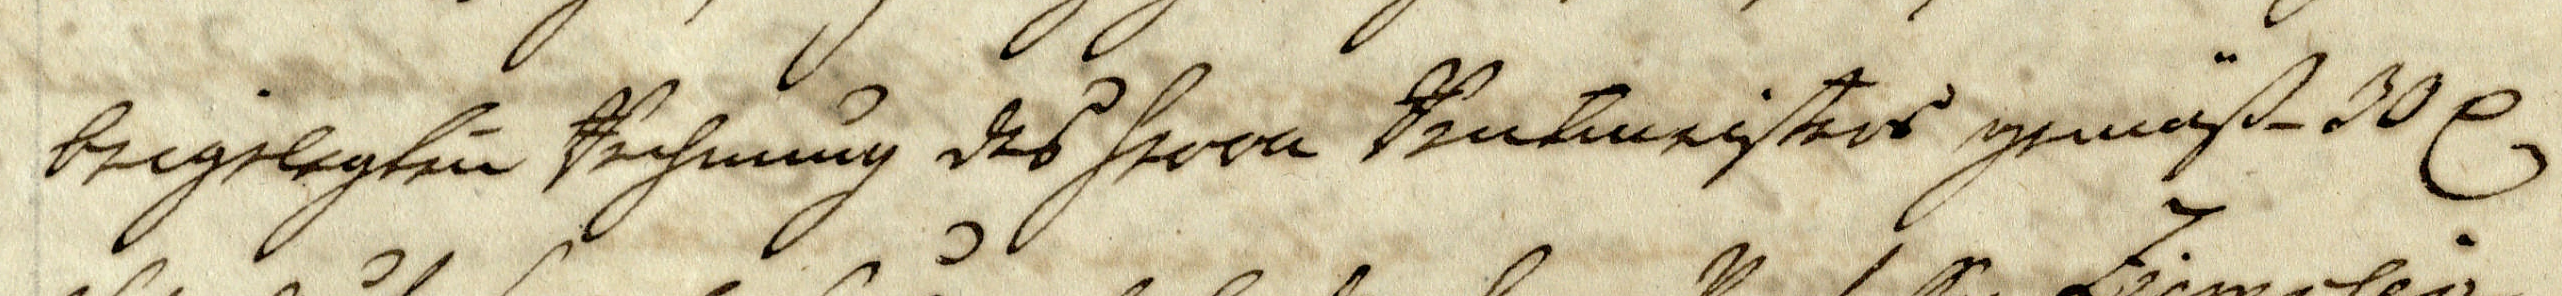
beigelegten Rechnung des Herrn Rentmeisters gemäß 30 l
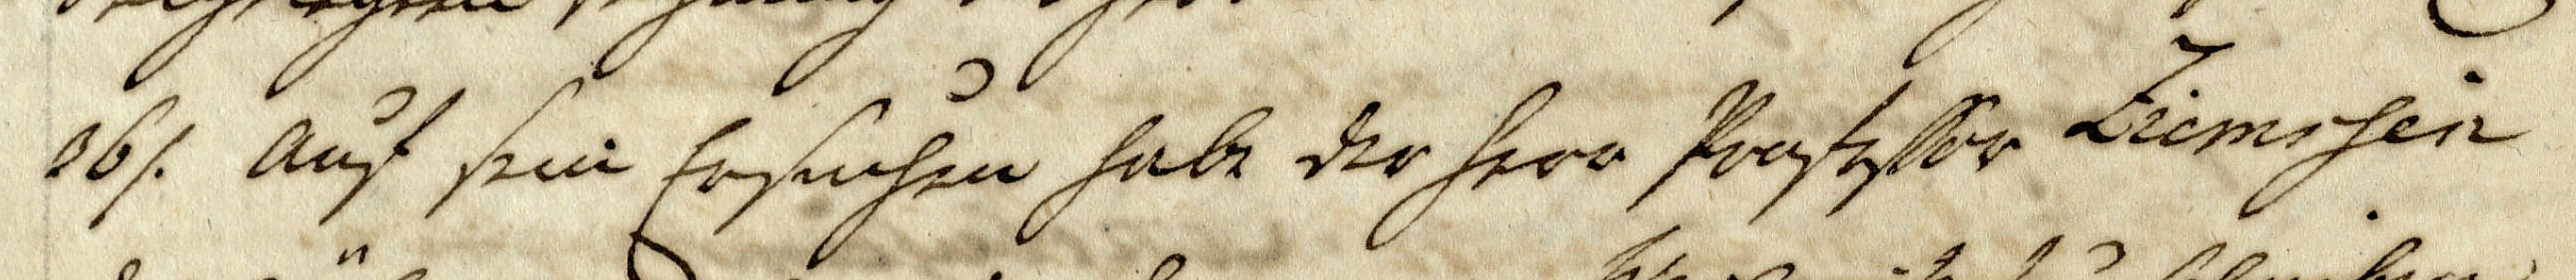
36 s. auf sein Ersuchen habe der Herr Professor Ziemssen
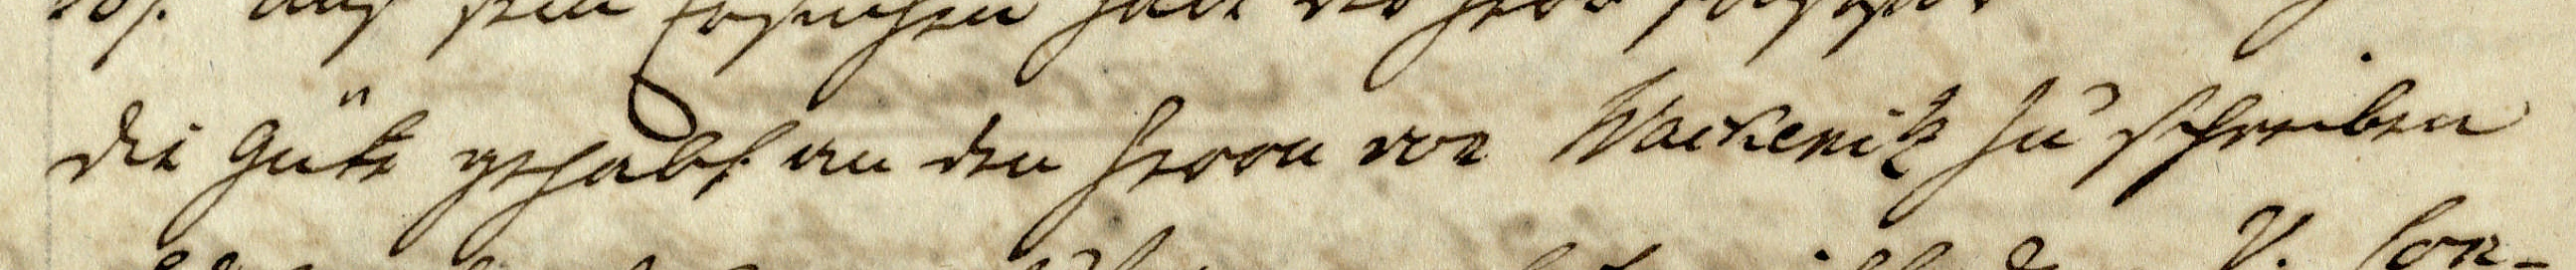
die Güte gehabt an den Herrn von Wackenitz zu schreiben
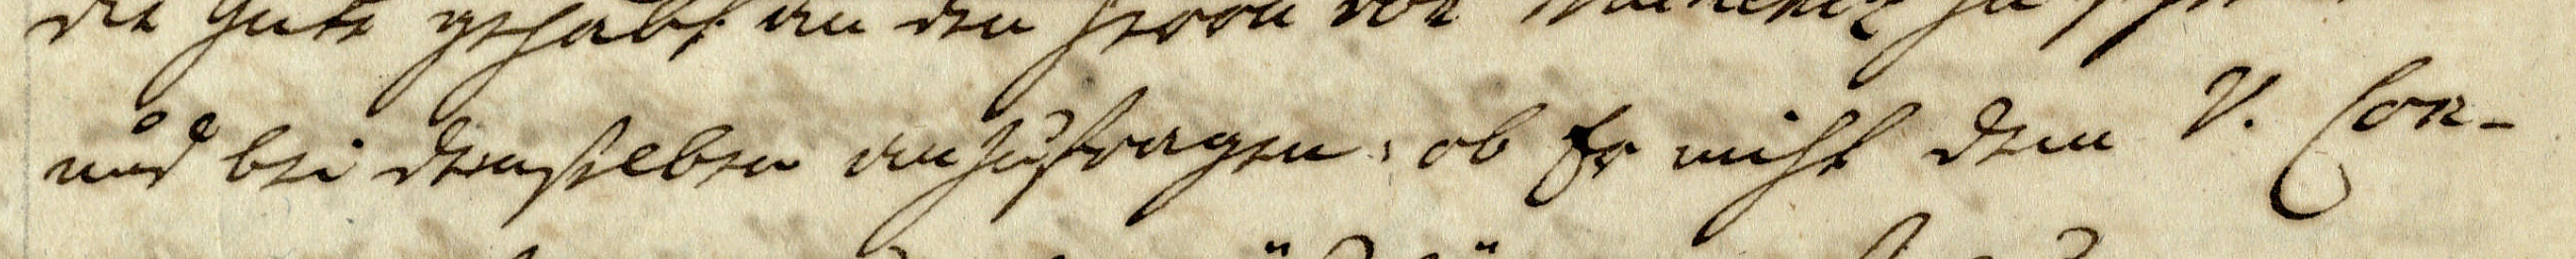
und bei demselben anzufragen: ob Er nicht dem V. Con¬
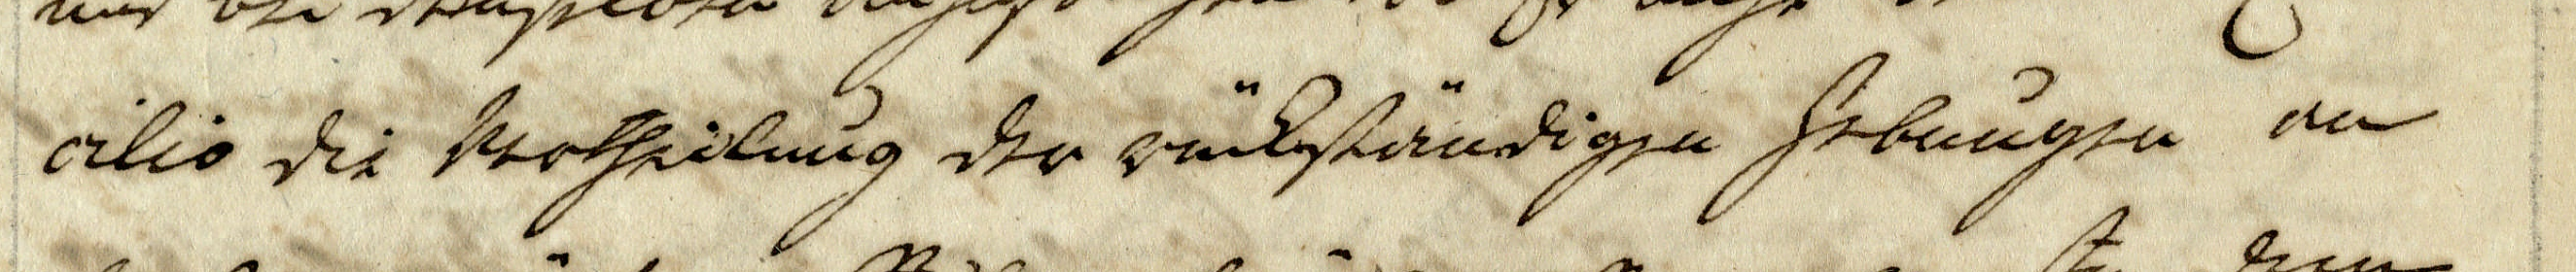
cilio die Vertheilung der rückständigen Hebungen an
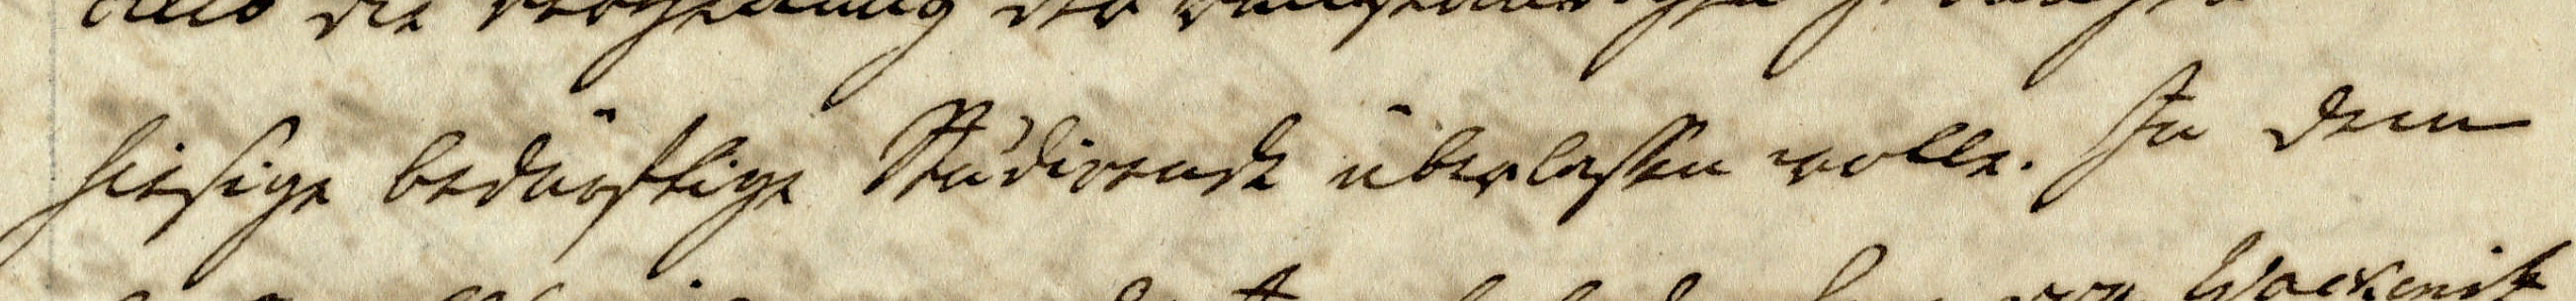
hiesige bedürftige Studirende überlassen wolle. In dem
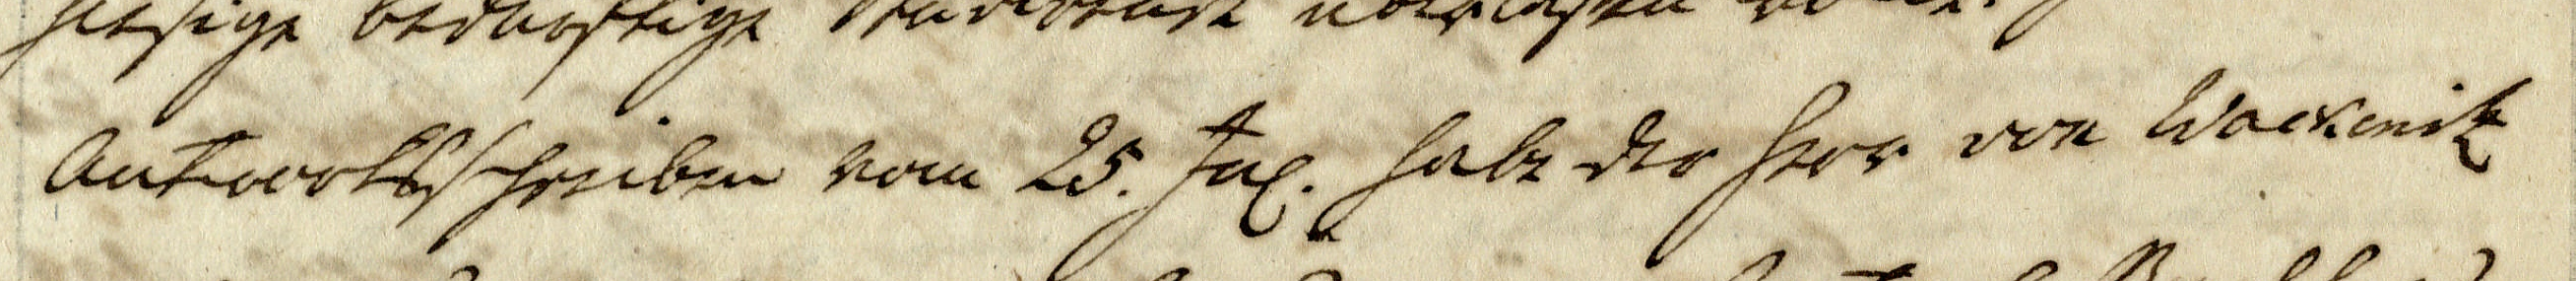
Antwortsschreiben vom 25. Jul. habe der Herr von Wackenitz
